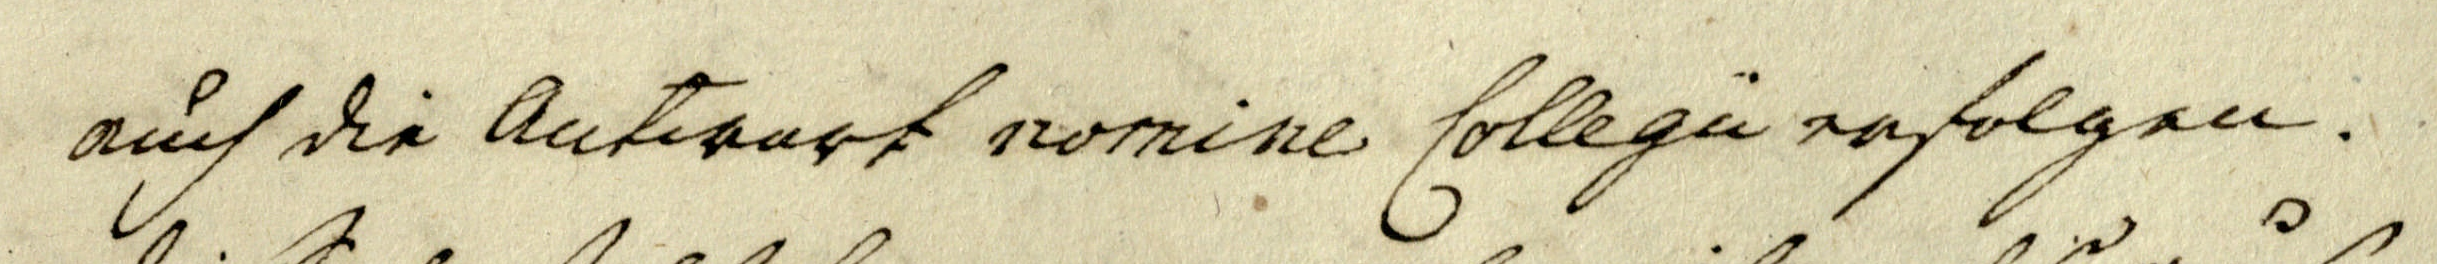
auch die Antwort nomine Collegii erfolgen.
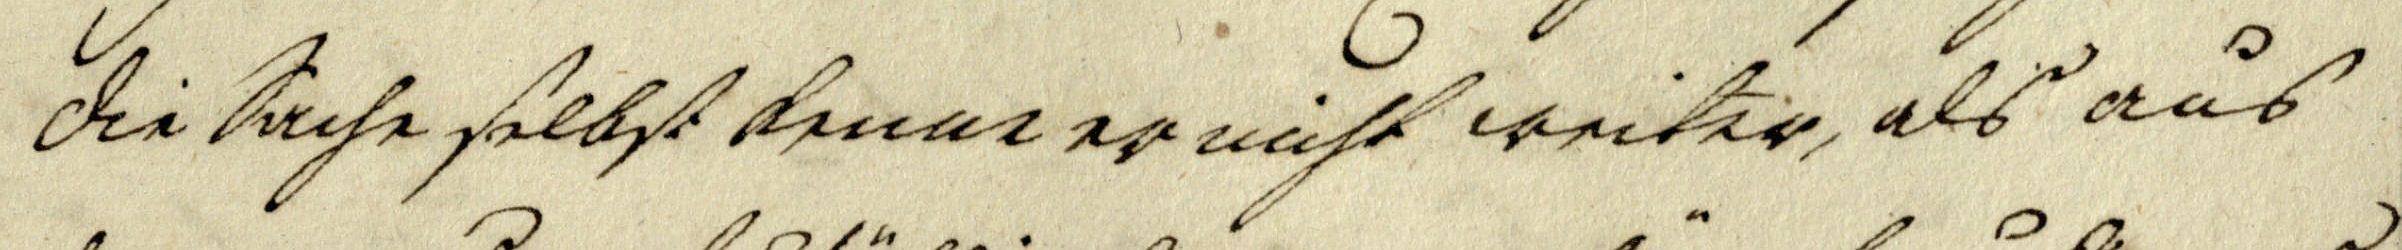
Die Sache selbst kenne er nicht weiter, als aus
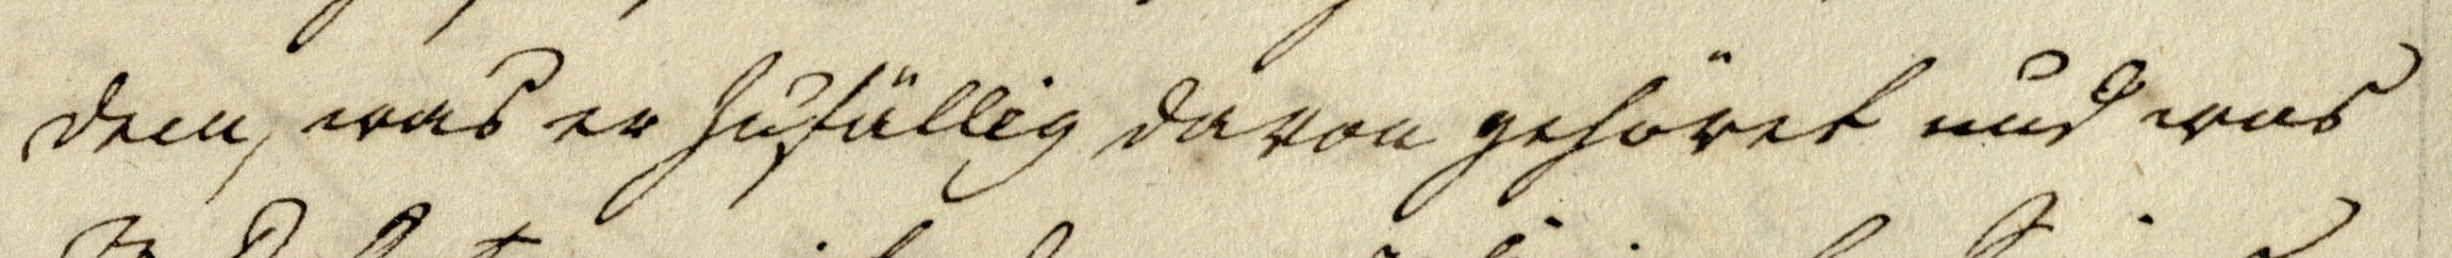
dem, was er zufällig davon gehöret und was
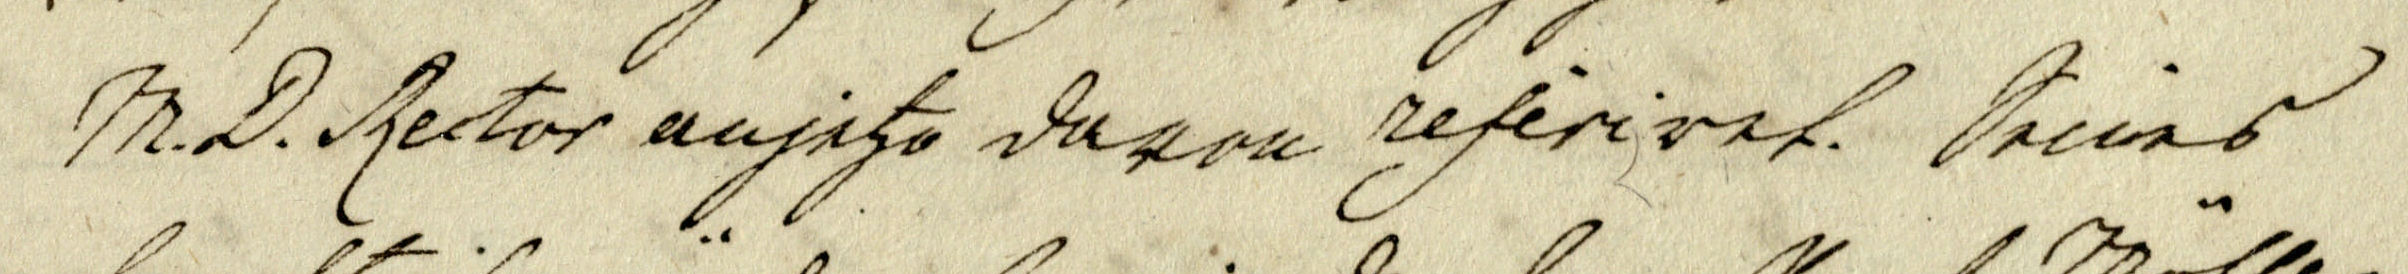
M. D. Rector anjetzo davon referiret. Seines
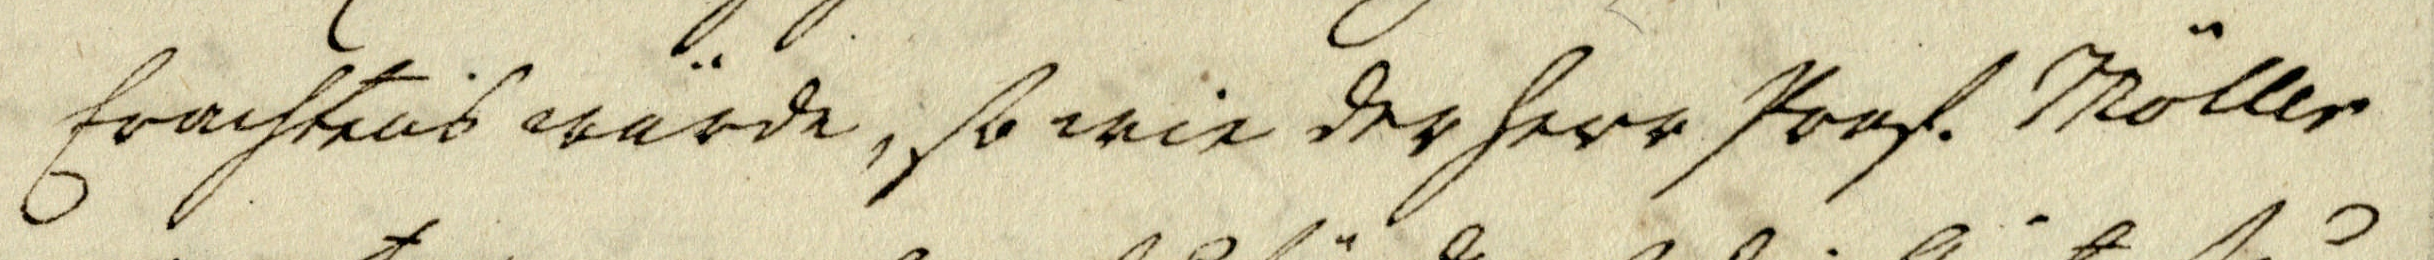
Erachtens würde, so wie der Herr Prof. Möller
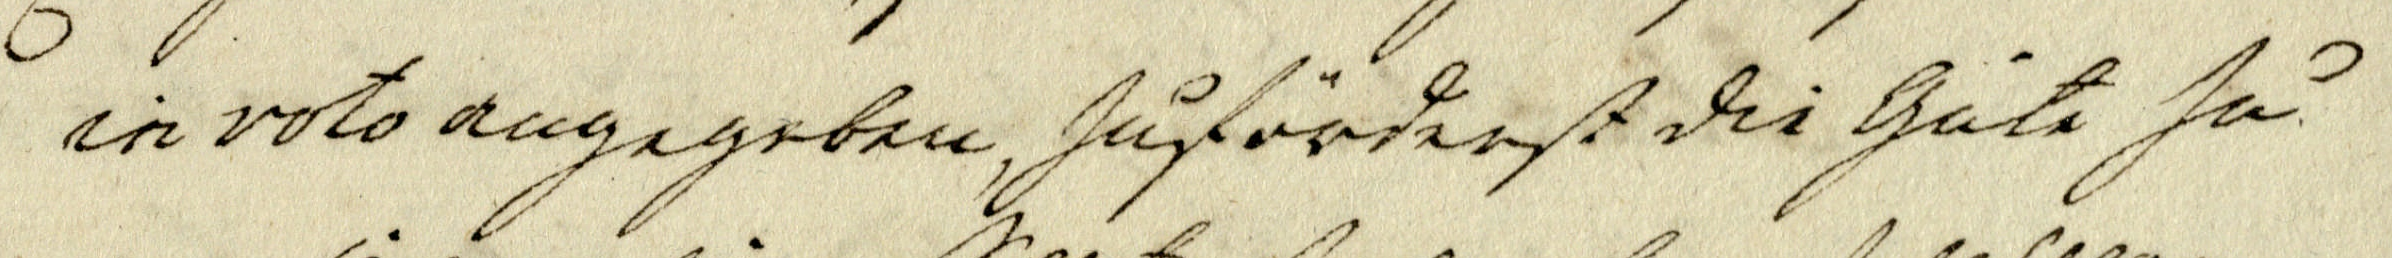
in voto angegeben, zuförderst die Güte zu
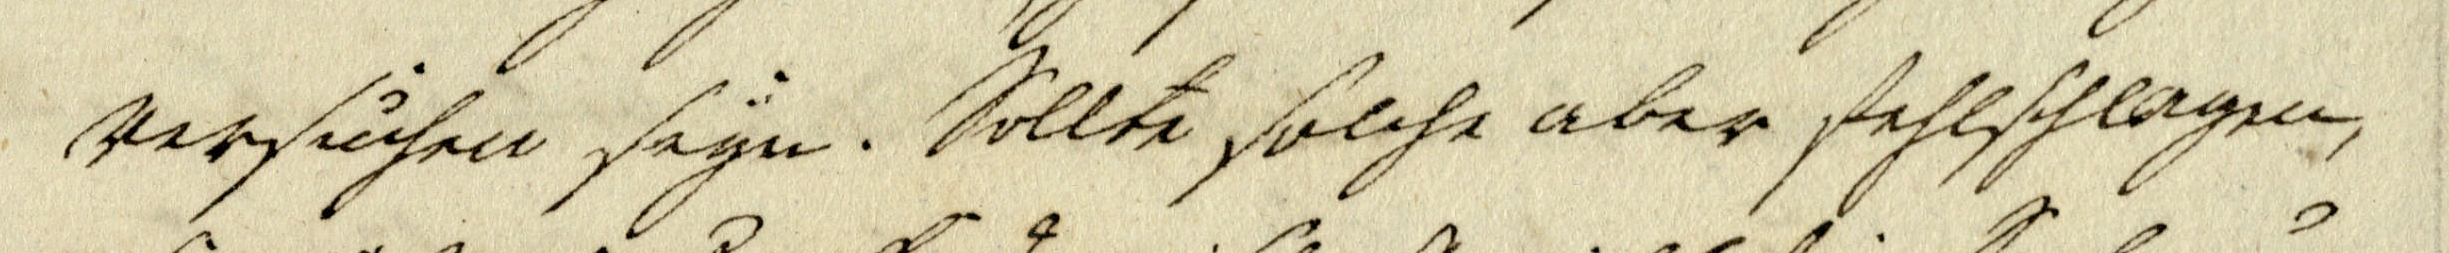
versuchen seÿn. Sollte solche aber fehlschlagen,
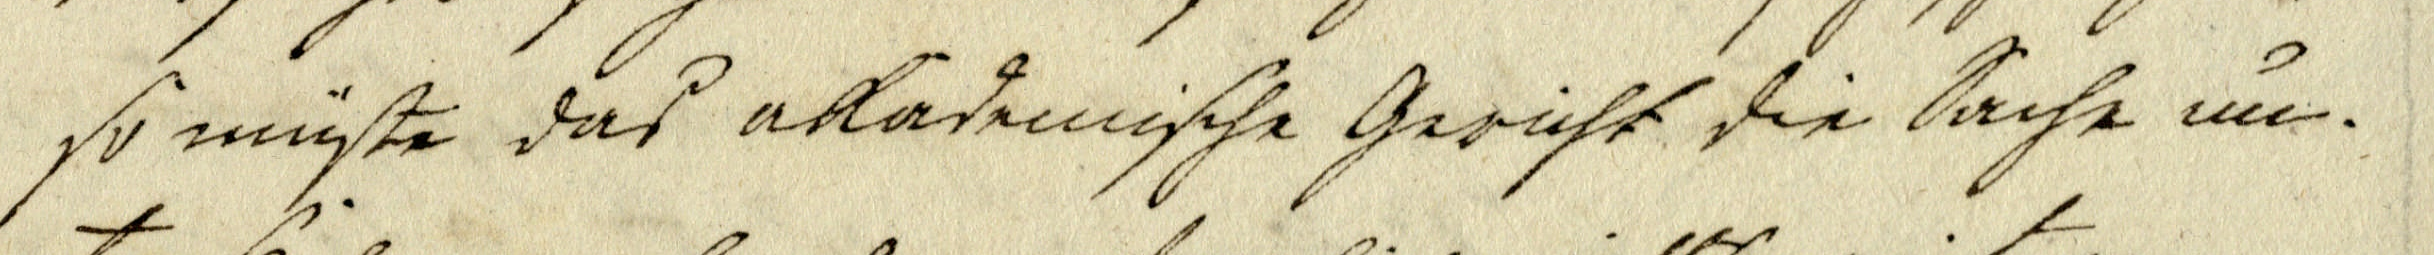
so müßte das akademische Gericht die Sache un¬
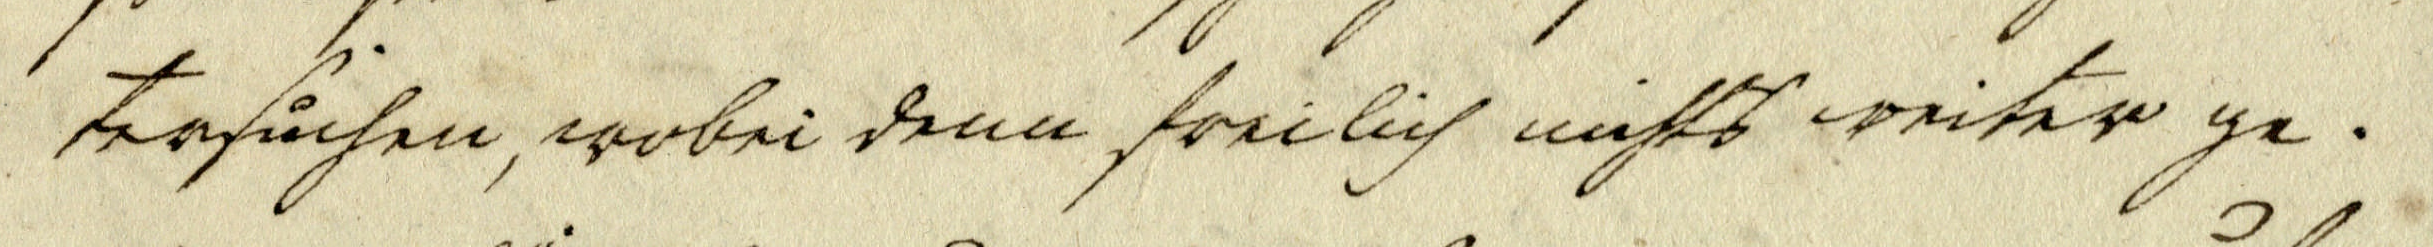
tersuchen, wobei denn freilich nichts weiter ge¬
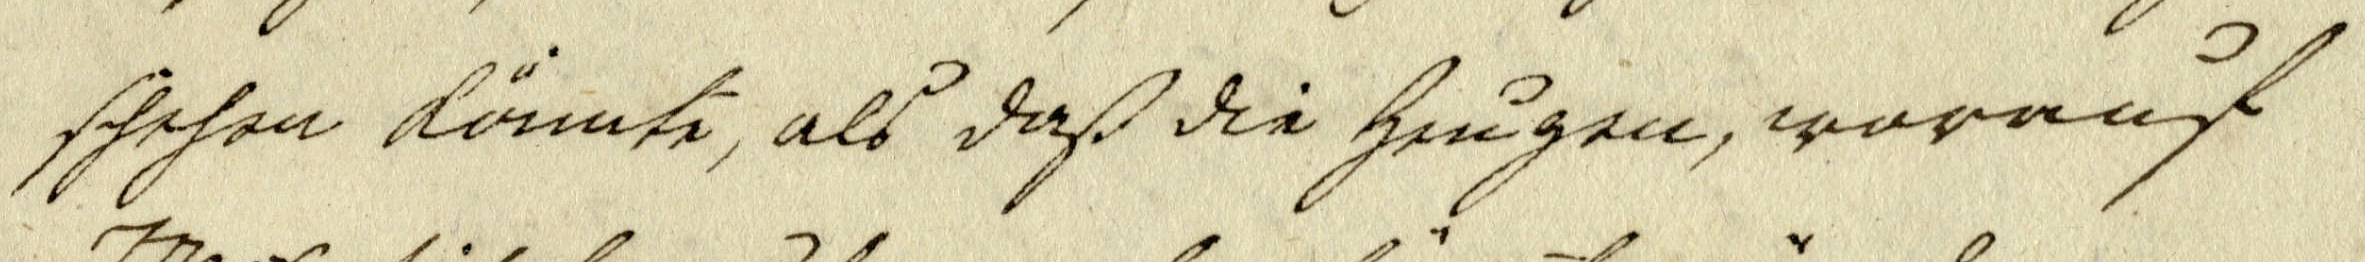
schehen könnte, als daß die Zeugen, worauf
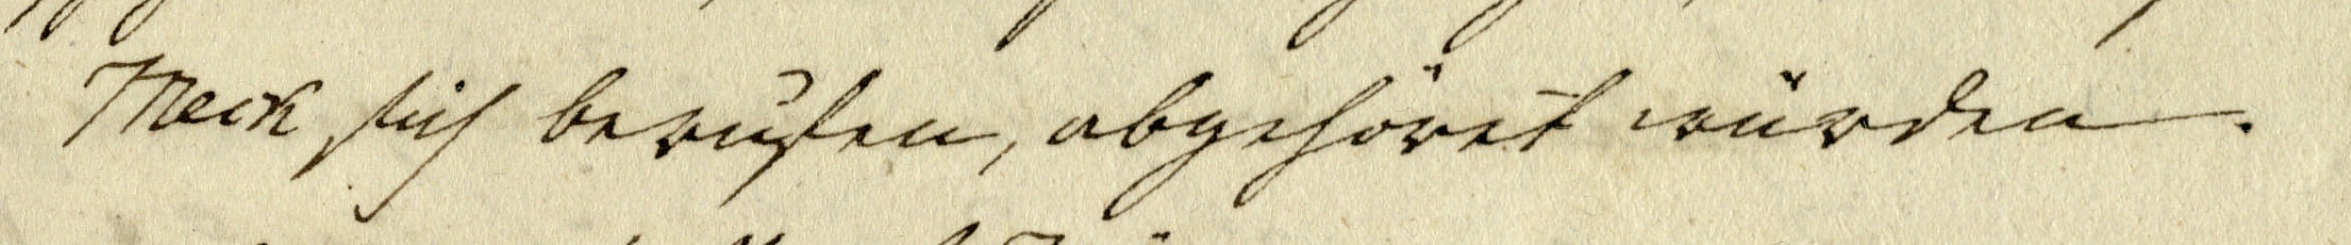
Meck sich berufen, abgehöret würden.
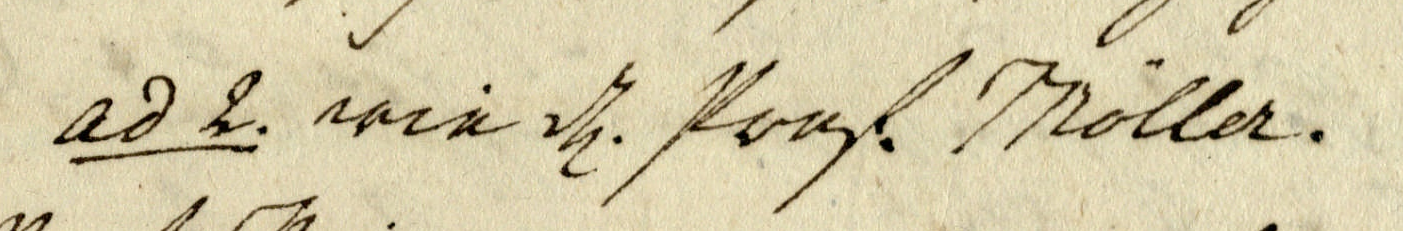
ad 2. wie dh. Prof. Möller.
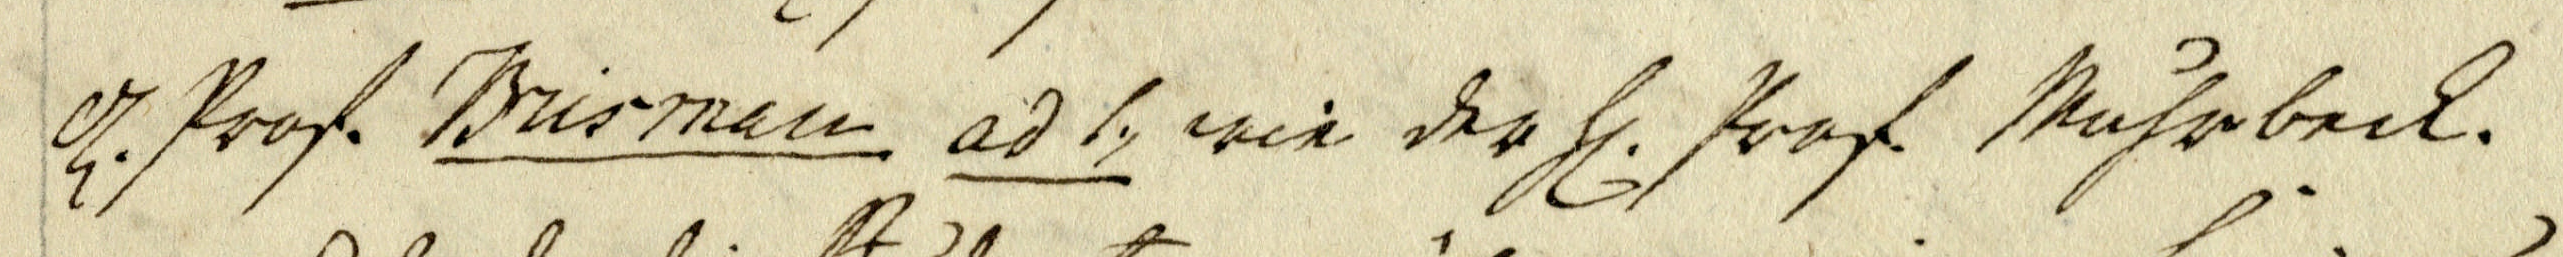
dh. Prof. Brisman. ad 1. wie der H. Prof. Muhrbeck.
